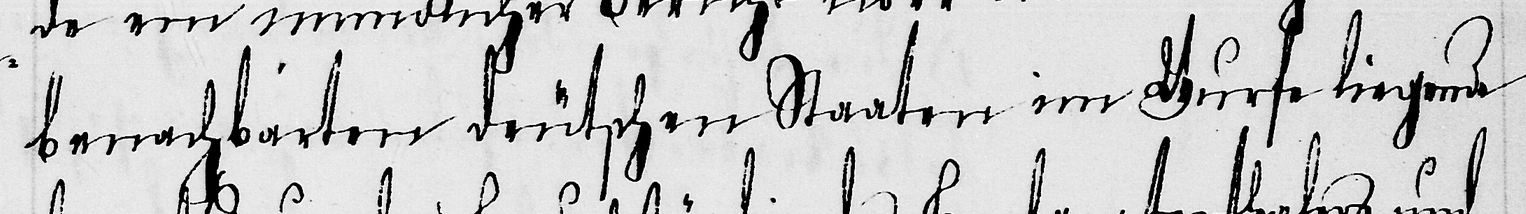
benachbarten deutschen Staaten im Wurfe liegende
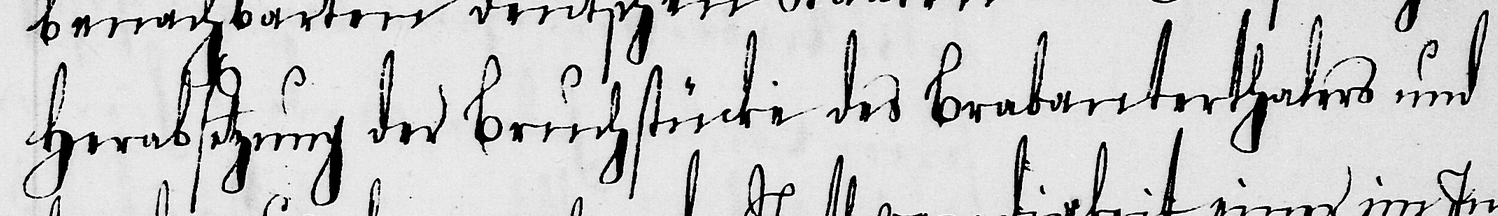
Herabsetzung der Bruchstücke des Brabanterthalers und
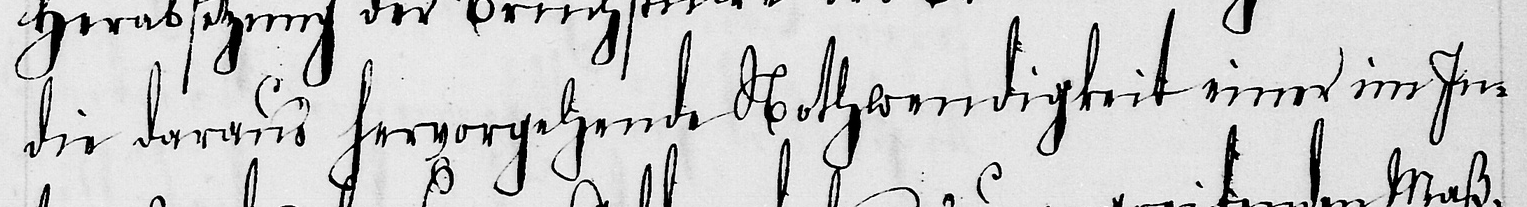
die daraus hervorgehende Nothwendigkeit einer im In¬
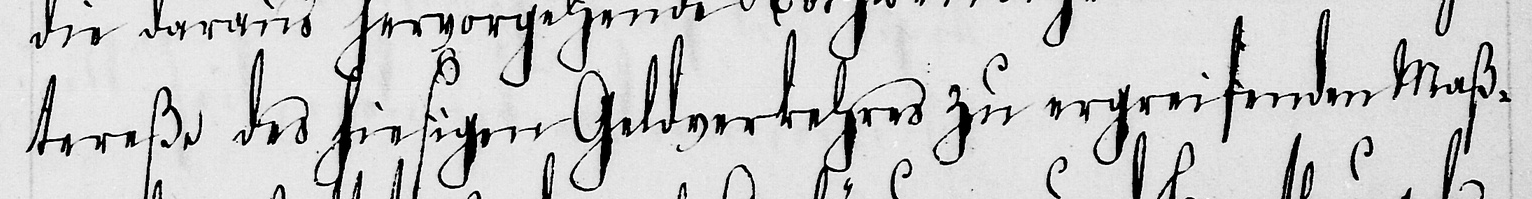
tereße des hiesigen Geldverkehres zu ergreifenden Maß¬
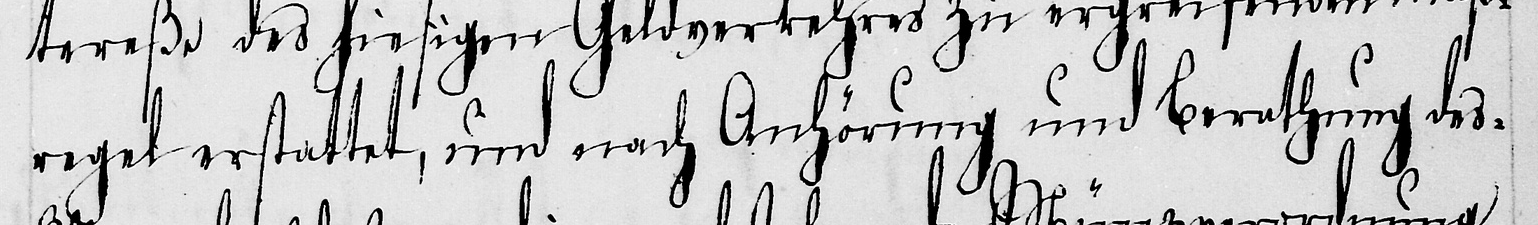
regel erstattet, und nach Anhörung und Berathung des¬
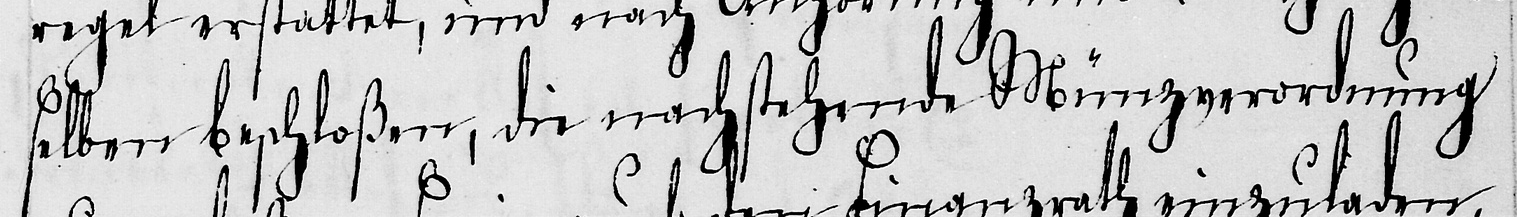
selben beschloßen, die nachstehende Münzverordnung
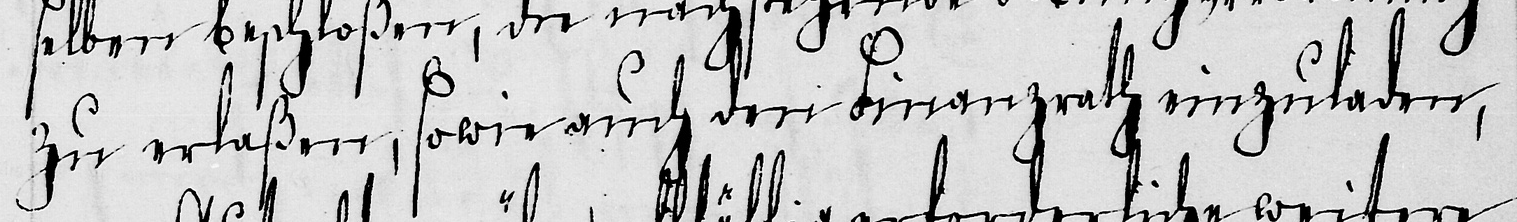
zu erlaßen, sowie auch den Finanzrath einzuladen,
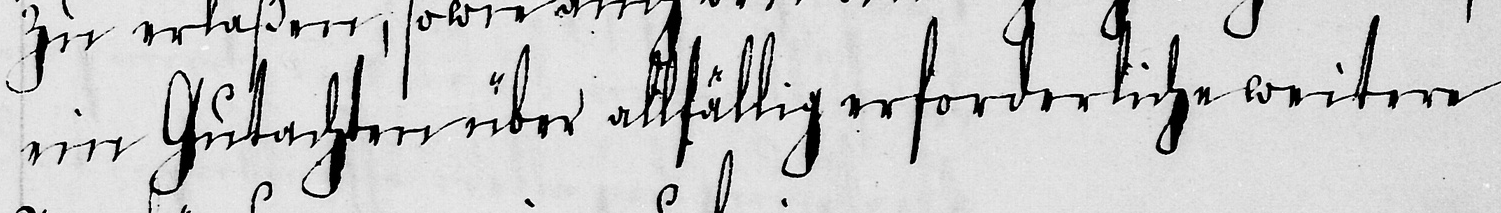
ein Gutachten über allfällige erforderliche weitere
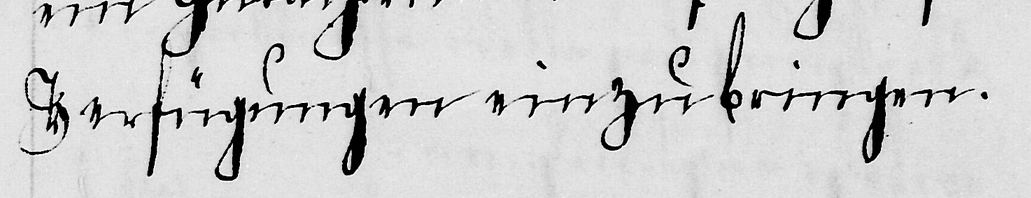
Verfügungen einzubringen.
